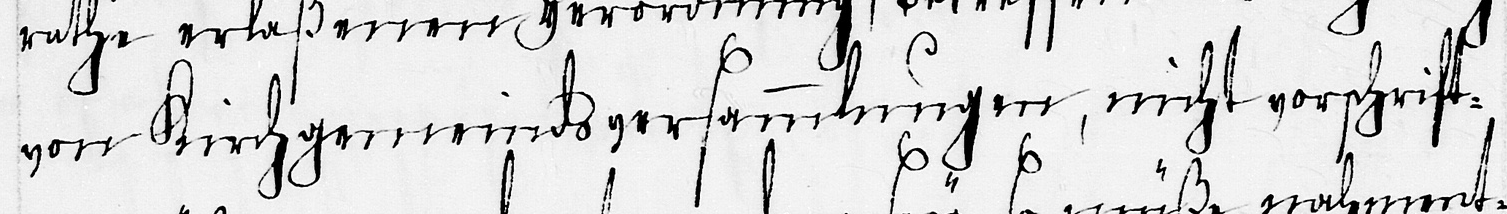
von Kirchgemeindsversammlungen, nicht vorschrift¬
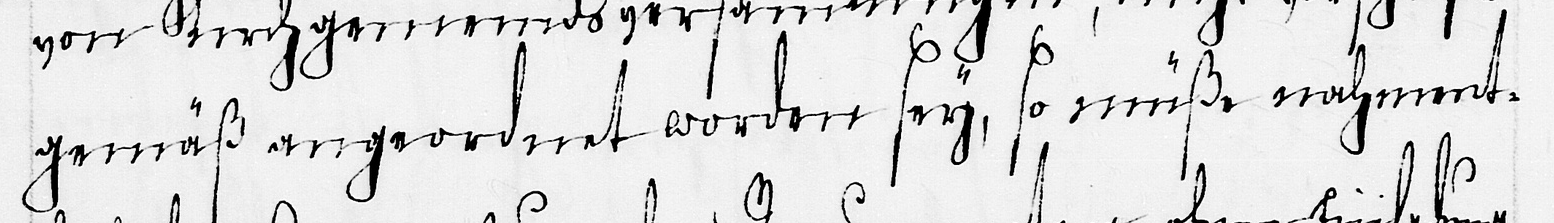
gemäß angeordnet worden sey, so müße nahment¬
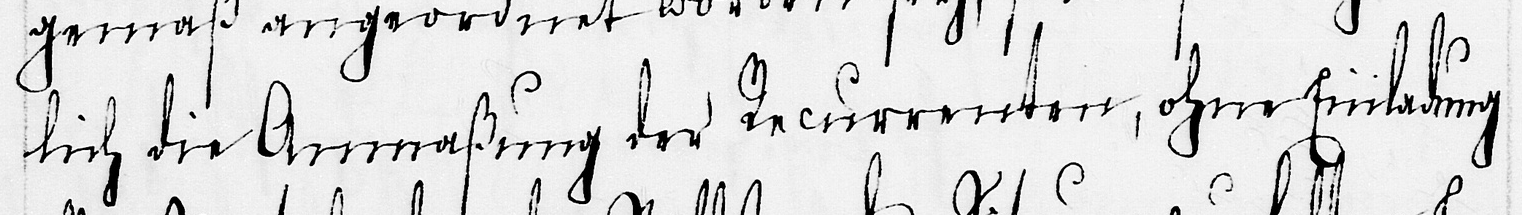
lich die Anmaßung der Recurrenten, ohne Einladung
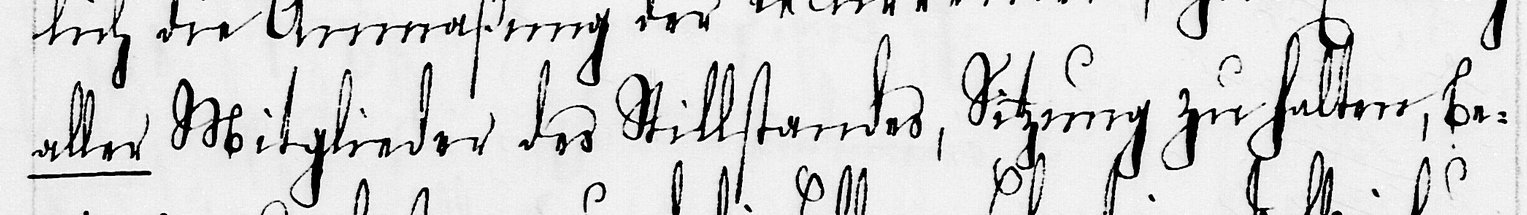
aller Mitglieder des Stillstandes, Sitzung zu halten, Be¬
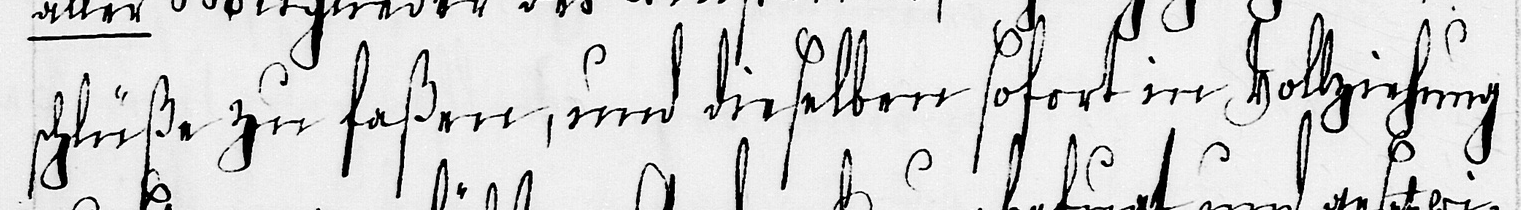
schlüße zu faßen, und dieselben sofort in Vollziehung
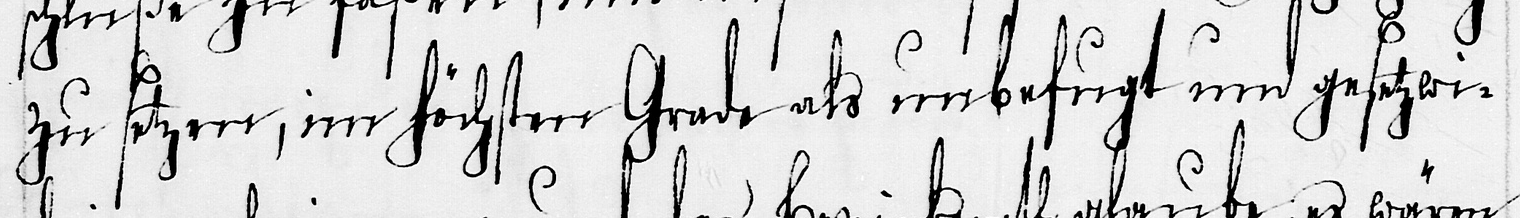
zu setzen, im Höchsten Grade als unbefugt und gesetzwi¬
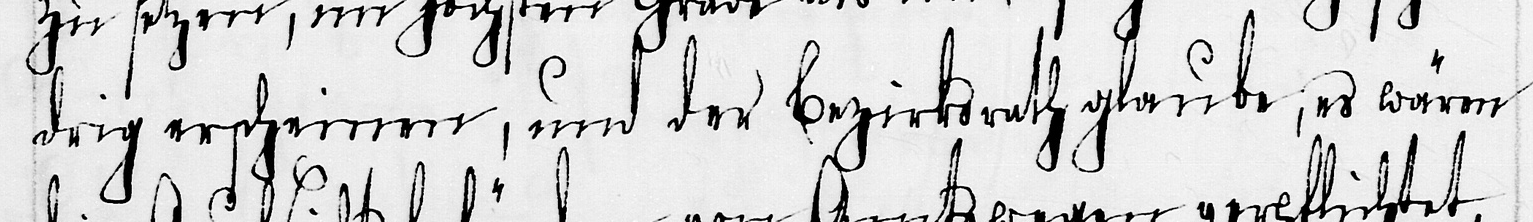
drig erscheinen, und der Bezirksrath glaube, es wären
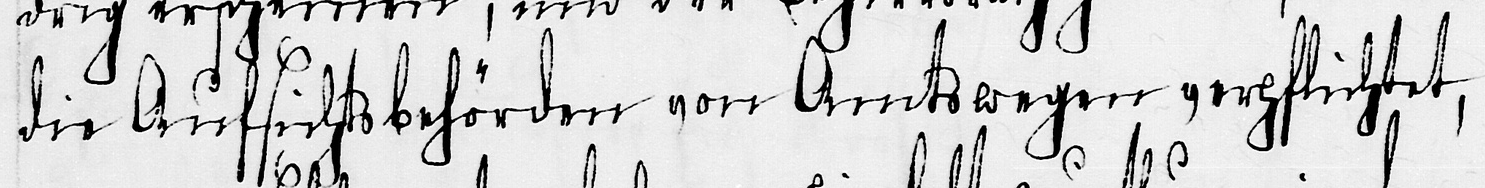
die Aufsichtsbehörden von Amtswegen verpflichtet,
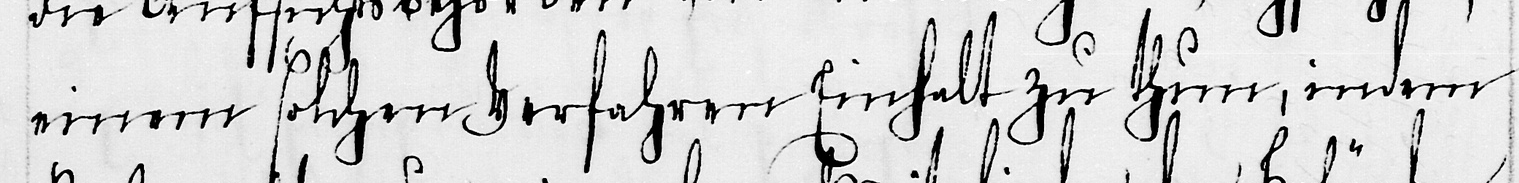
einem solchen Verfahren Einhalt zu thun, indem
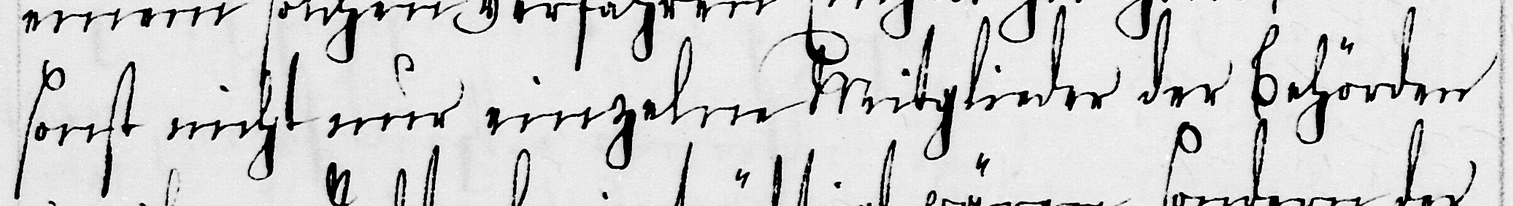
sonst nicht nur einzelne Mitglieder der Behörden
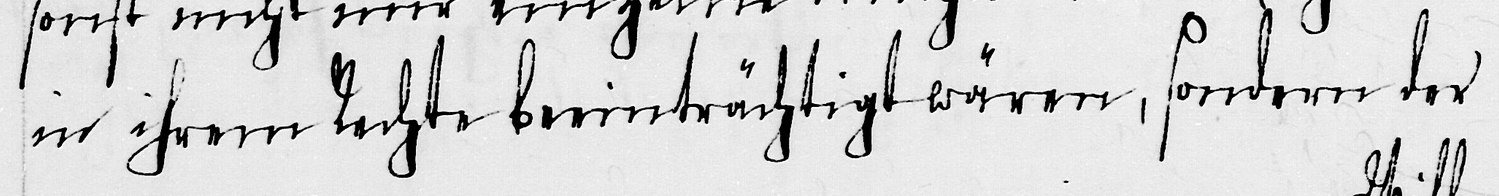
in ihrem Rechte beeinträchtigt wären, sondern der
